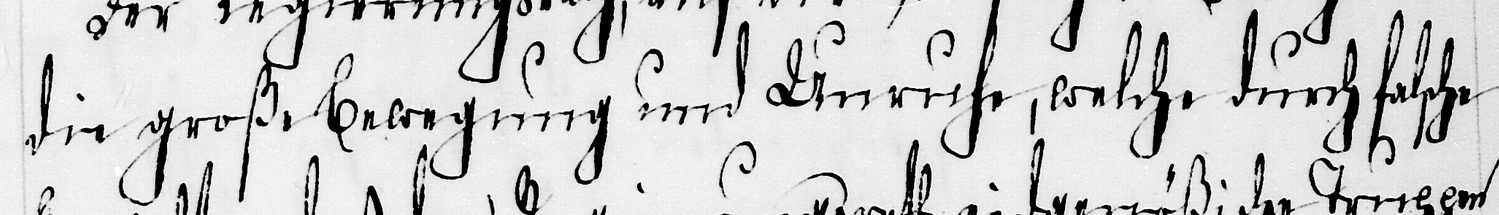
die große Bewegung und Unruhe, welche durch falsche
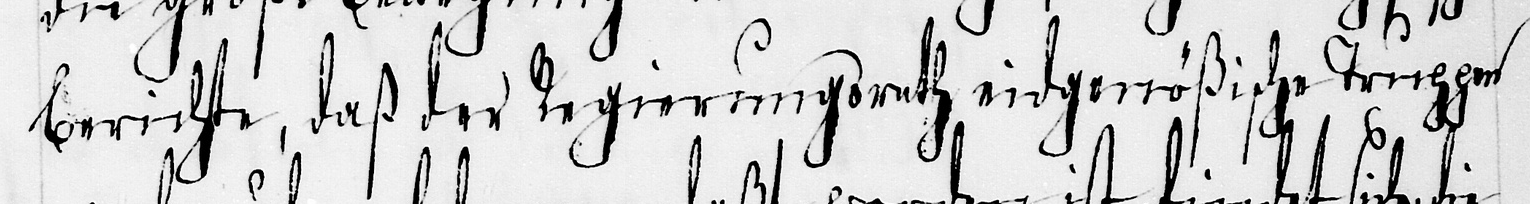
Berichte, daß der Regierungsrath eidgenößische Truppen
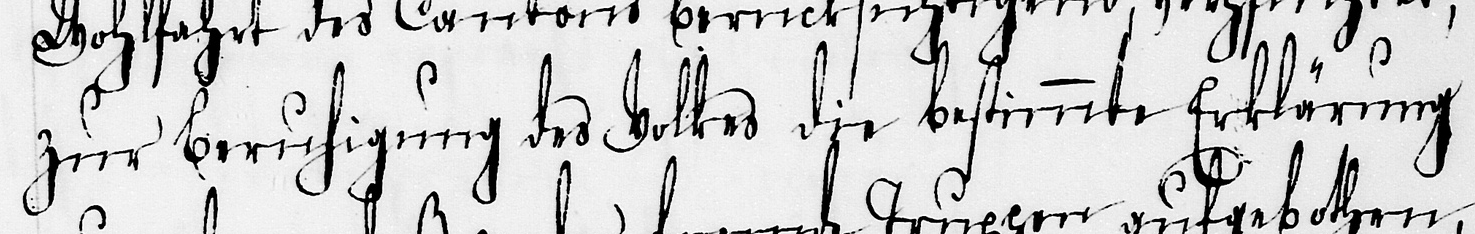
zur Beruhigung des Volkes die bestimmte Erklärung
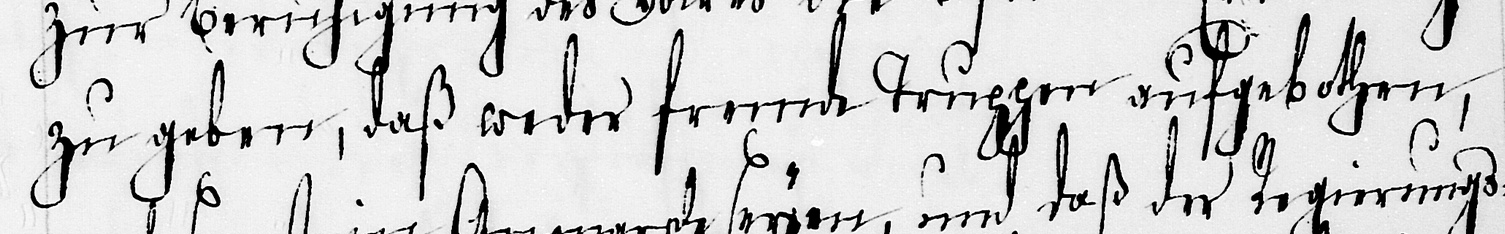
zu geben, daß weder fremde Truppen aufgebothen,
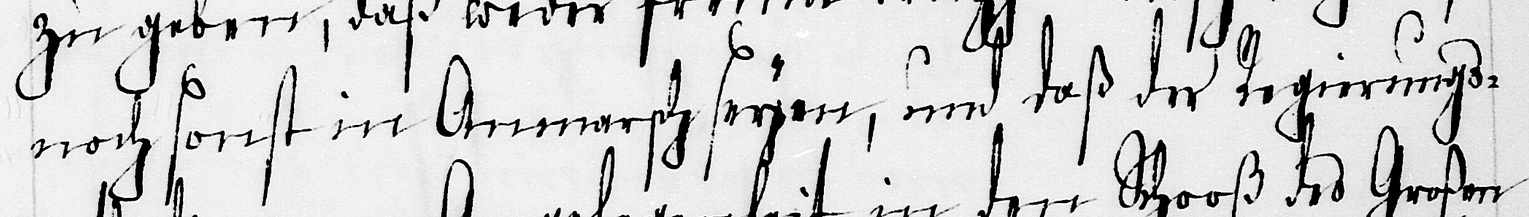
noch sonst in Anmarsch seyen, und daß der Regierungs¬
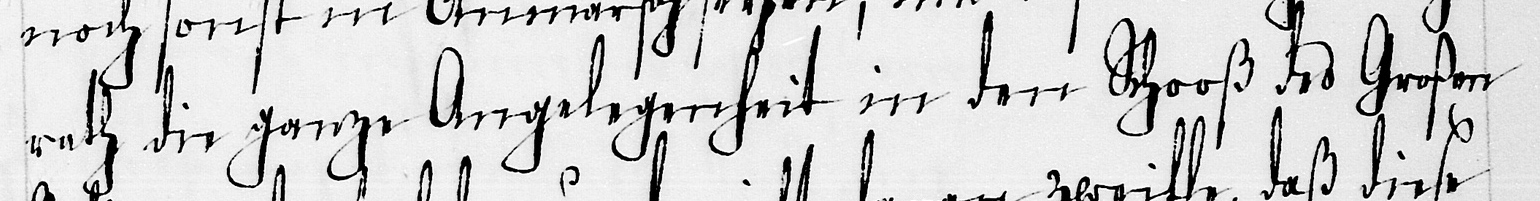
rath die ganze Angelegenheit in den Schooß des Großen
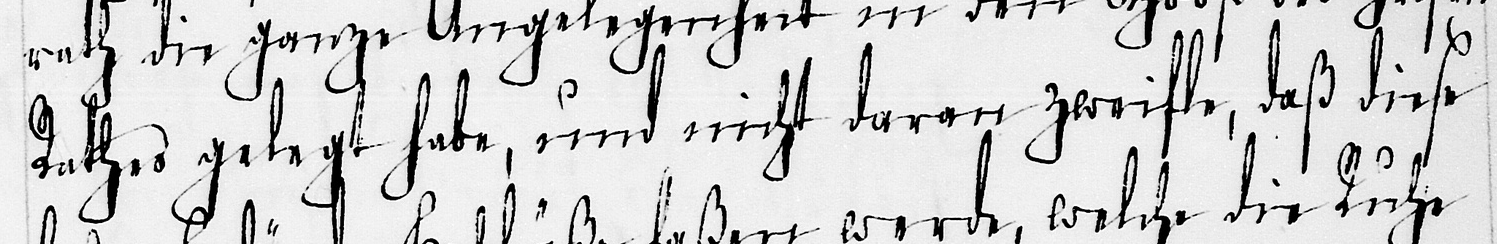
Rathes gelegt habe, und nicht daran zweifle, daß diese
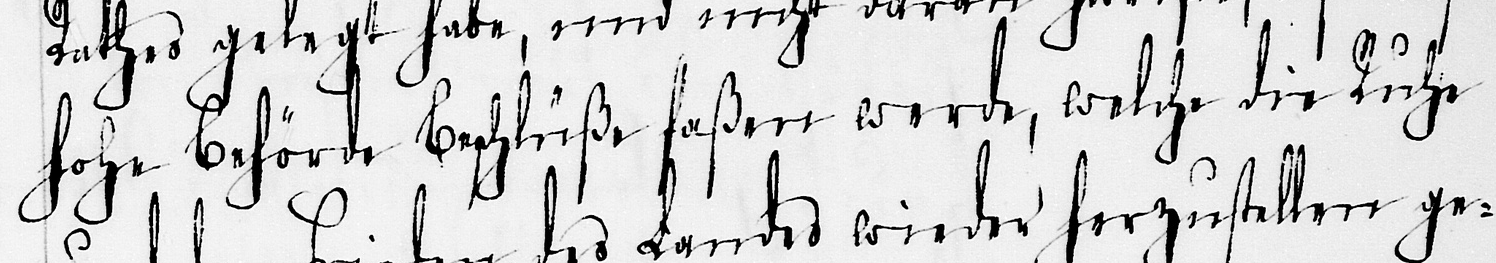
hohe Behörde Beschlüße faßen werde, welche die Ruhe
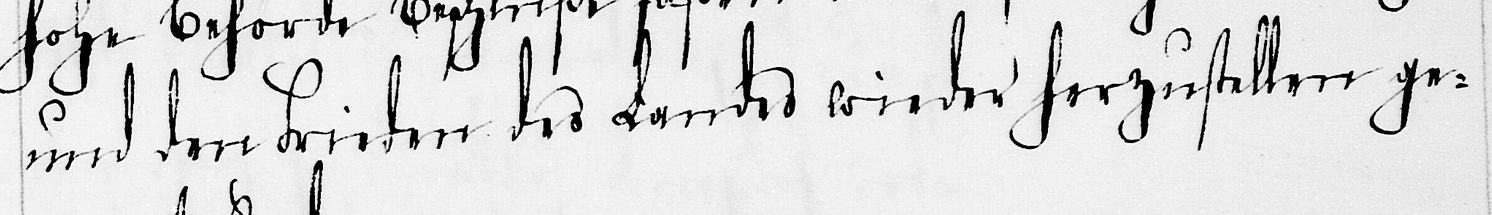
und den Frieden des Landes wieder herzustellen ge¬
